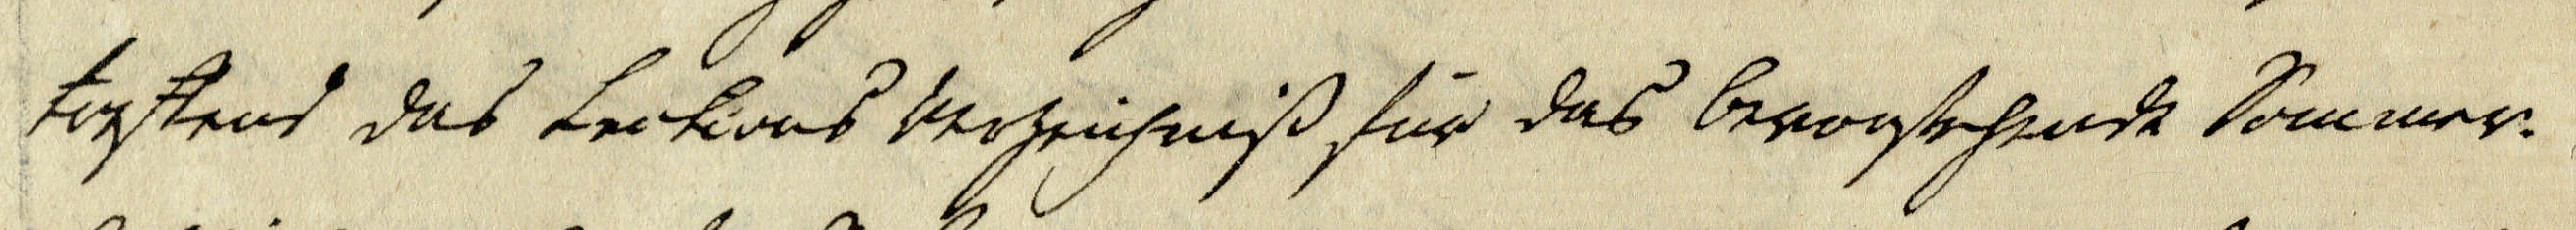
treffend das Lections Verzeichniß für das bevorstehende Sommer¬
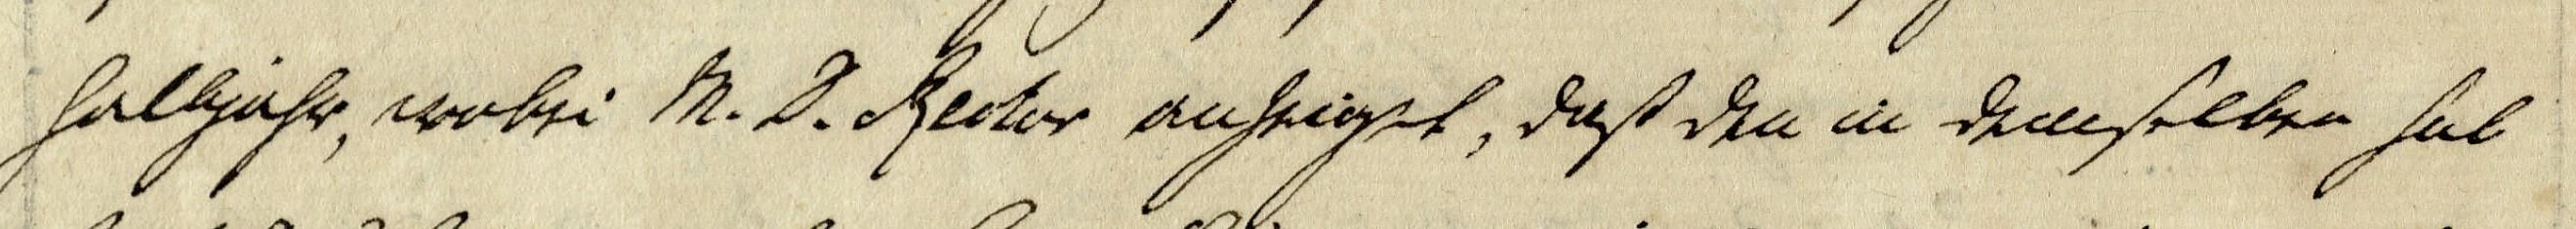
halbjahr, wobei M. D. Rector anzeiget, daß den in demselben sub
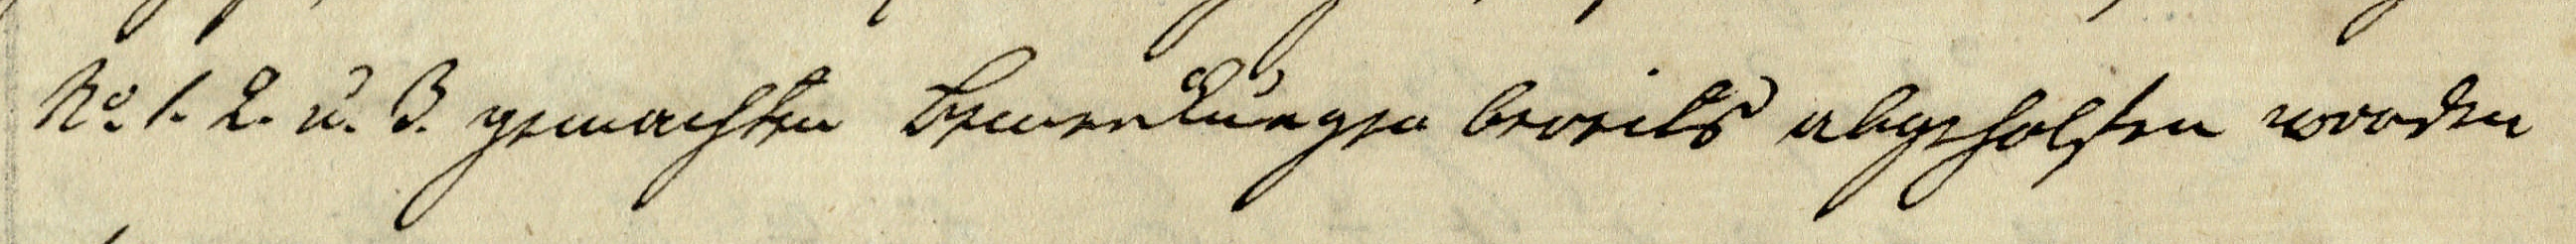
No. 1. 2. u. 3. gemachten Bemerckungen bereits abgeholfen worden
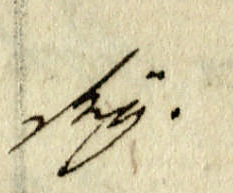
seÿ.
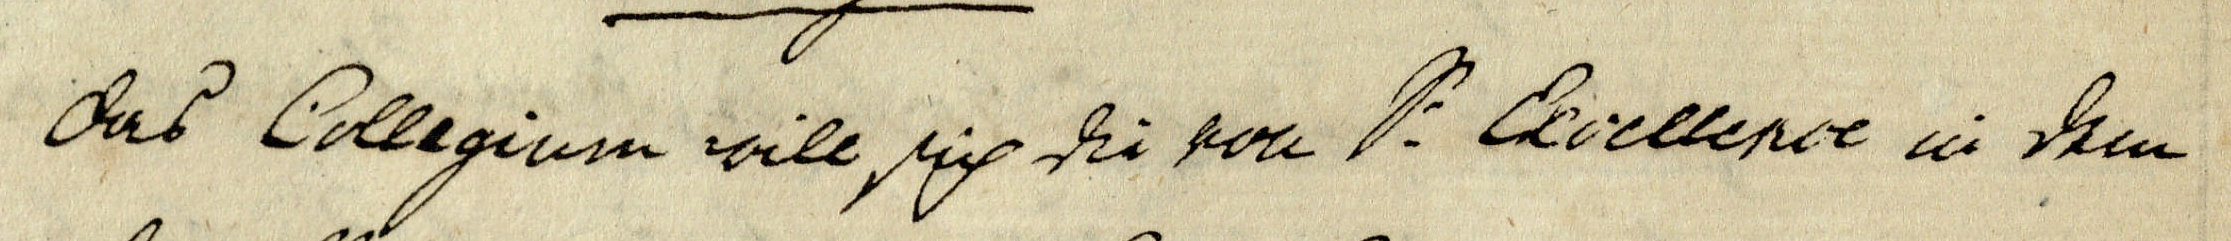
Das Collegium will sich die von Sr Excellence in dem
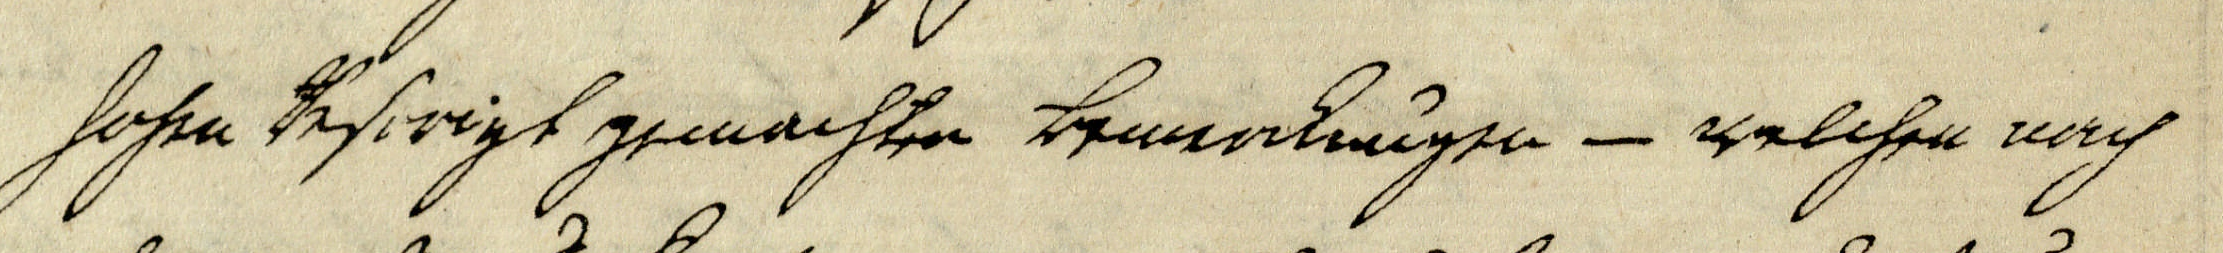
hohen Rescript gemachten Bemerckungen - welchen nach
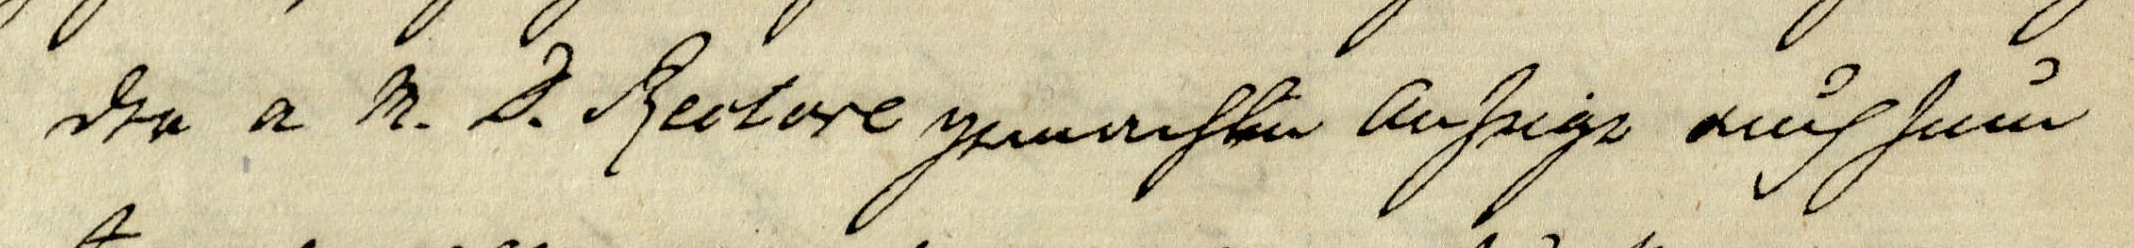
der a M. D. Rectore gemachten Anzeige auch zum
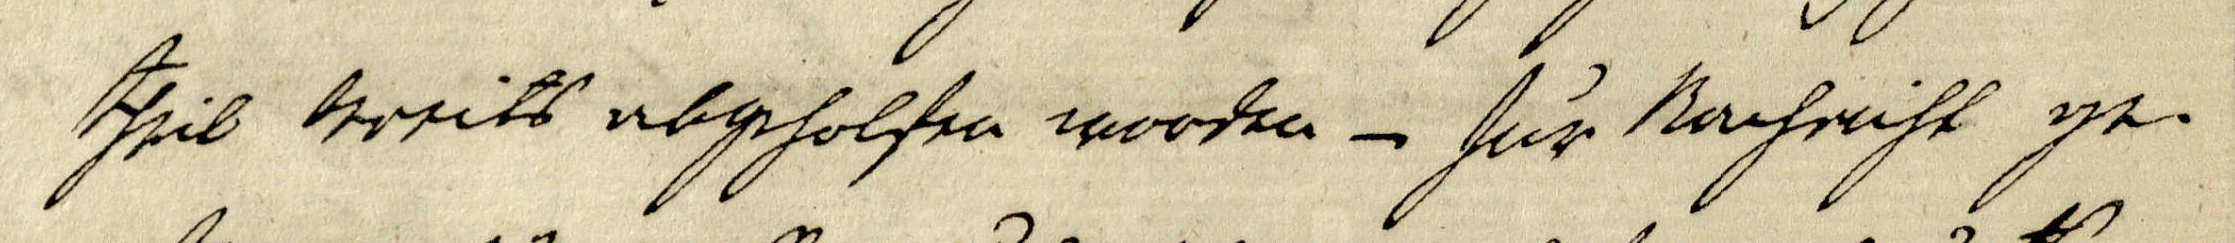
Theil bereits abgeholfen worden - zur Nachricht ge¬
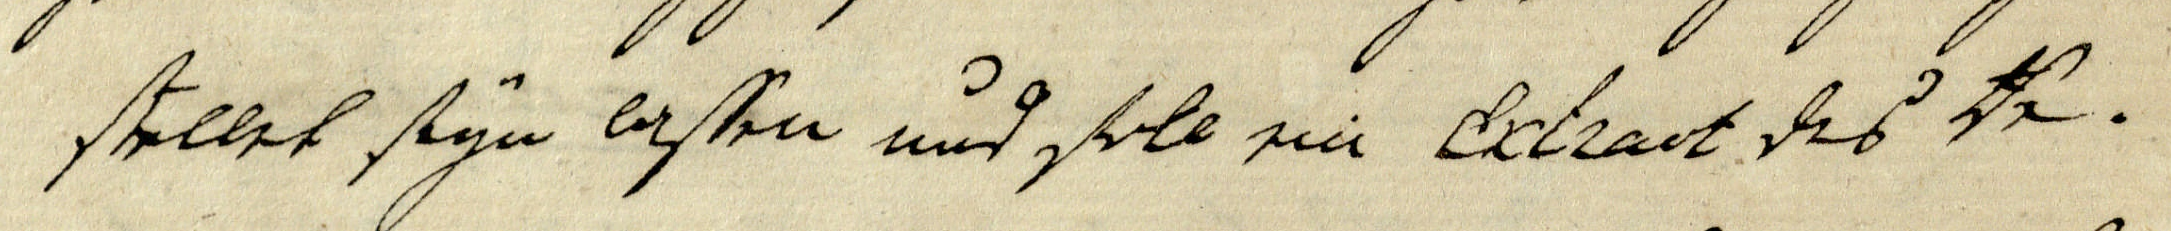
stellet seÿn lassen und soll ein Extract des Re¬
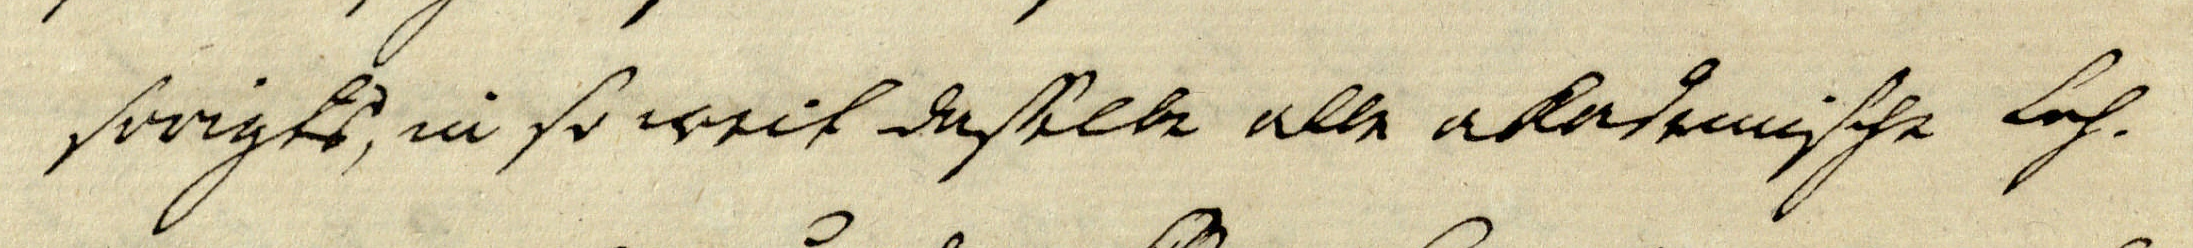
scripts, in so weit dasselbe alle akademische Leh¬
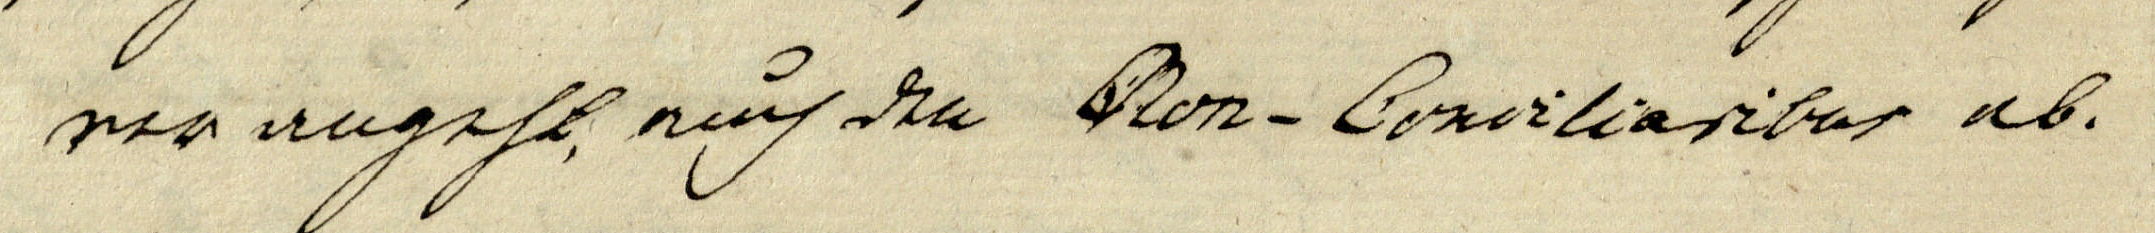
rer angeht, auch den Non- Conciliaribus ab¬
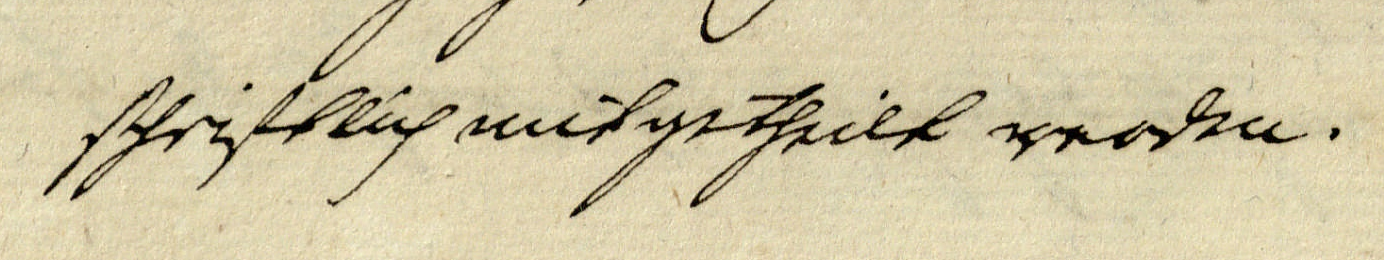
schriftlich mitgetheilt werden.
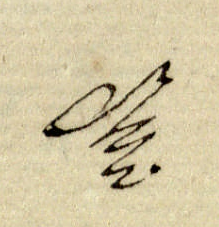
dh
